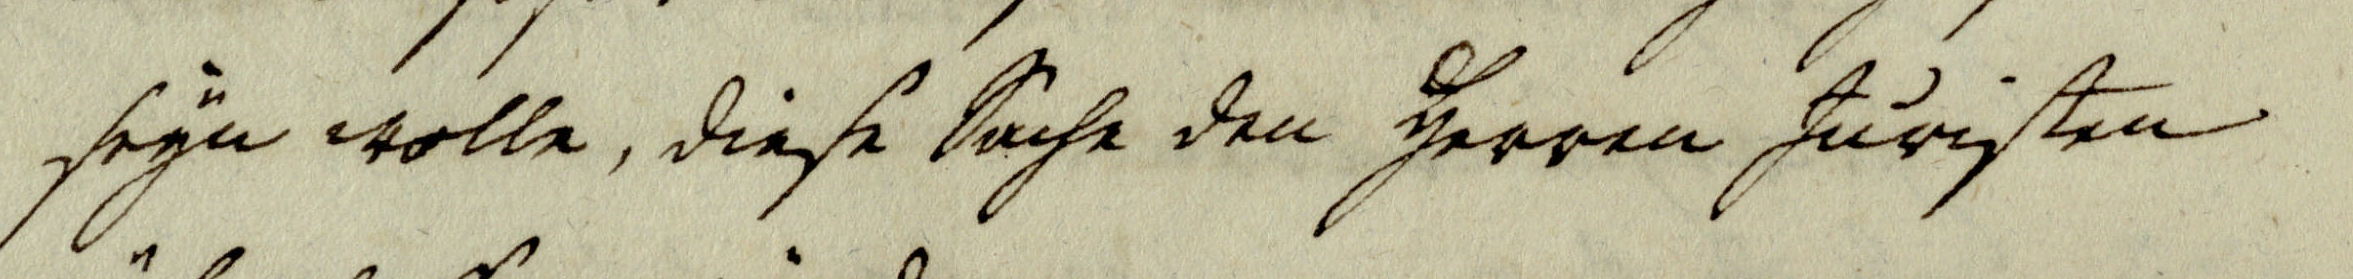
seÿn wolle, diese Sache den Herren Juristen
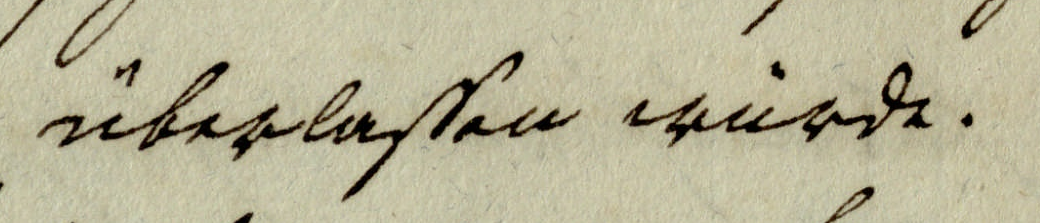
überlassen würde.
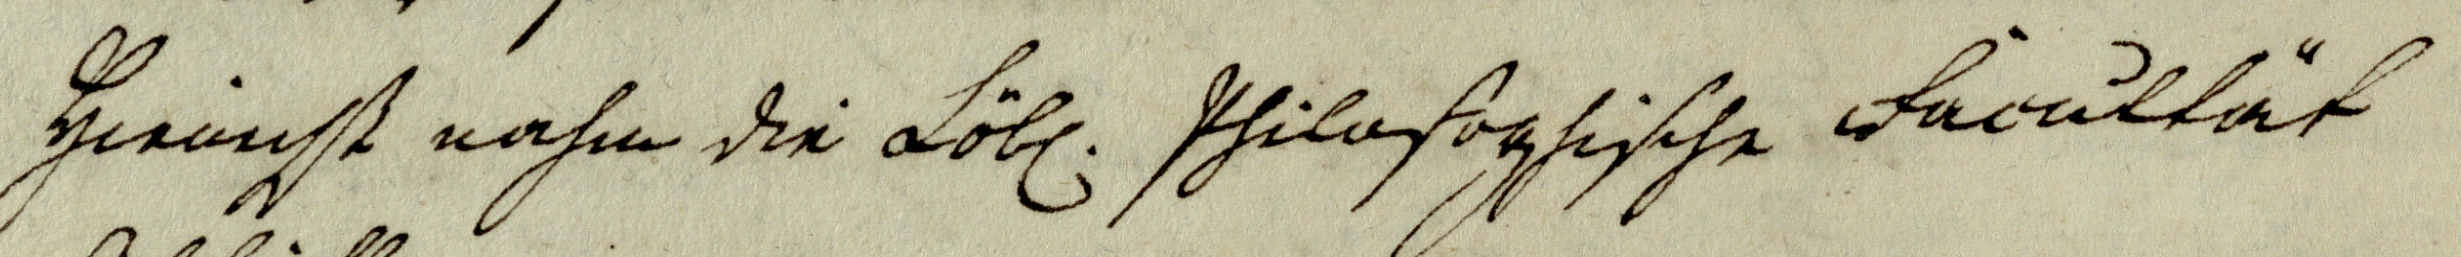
Hienechst nahm die Löbl. Philosophische Facultät
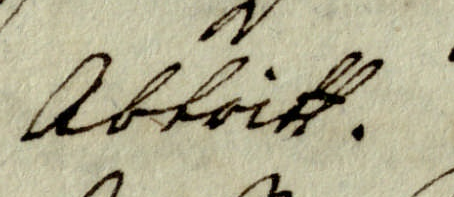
Abtritt.
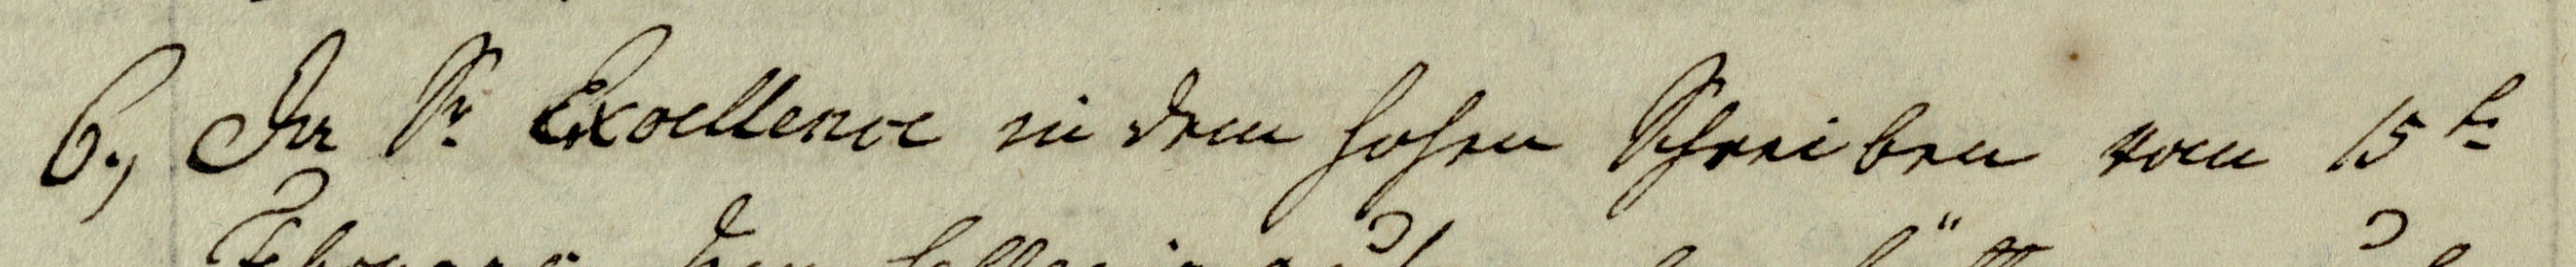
6., Da Sr Excellence in dem hohen Schreiben vom 15 te
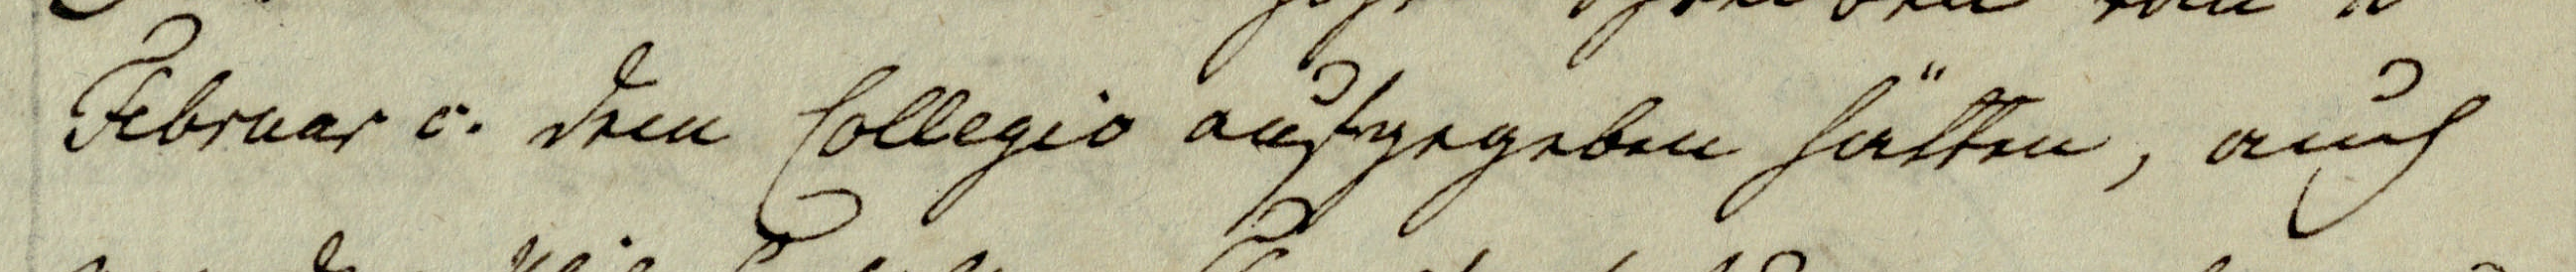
Februar c. dem Collegio aufgegeben hätten, auch
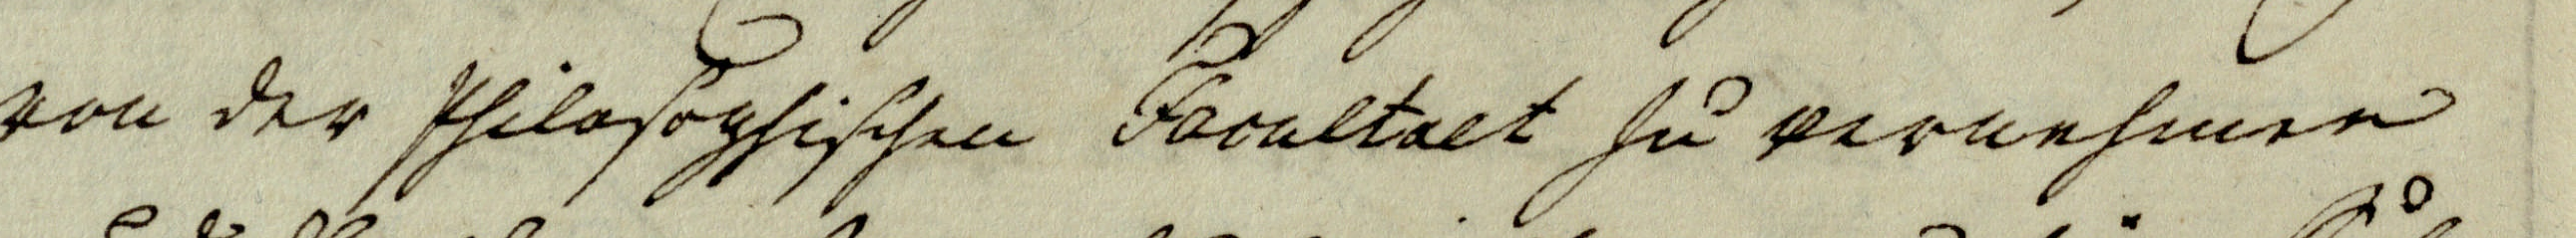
von der Philosophischen Facultaet zu vernehmen
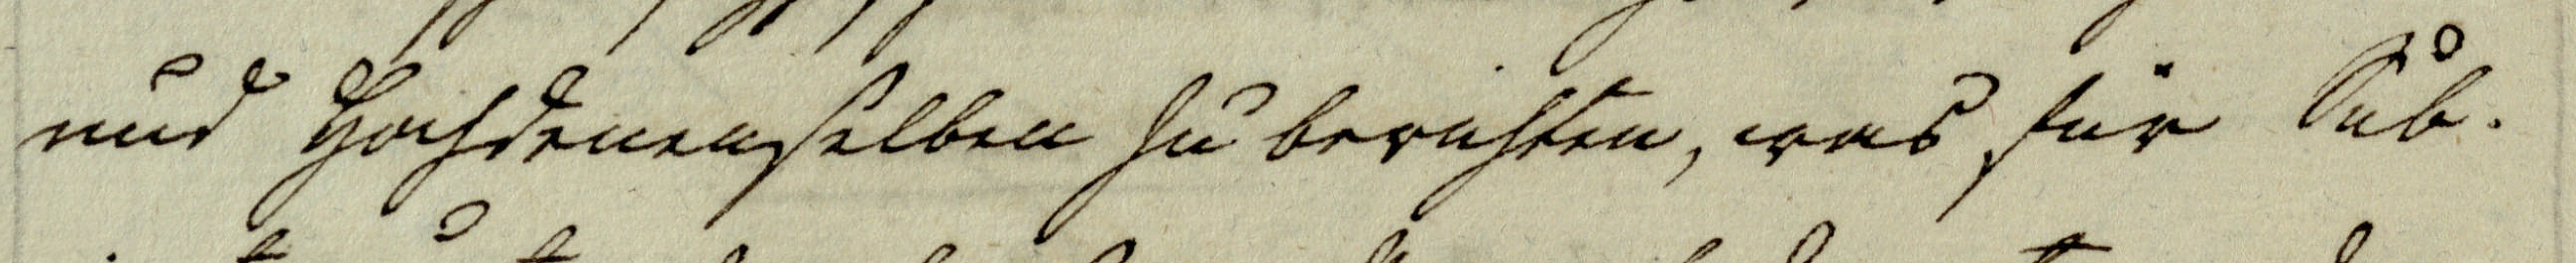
und Hochdenenselben zu berichten, was für Sub¬
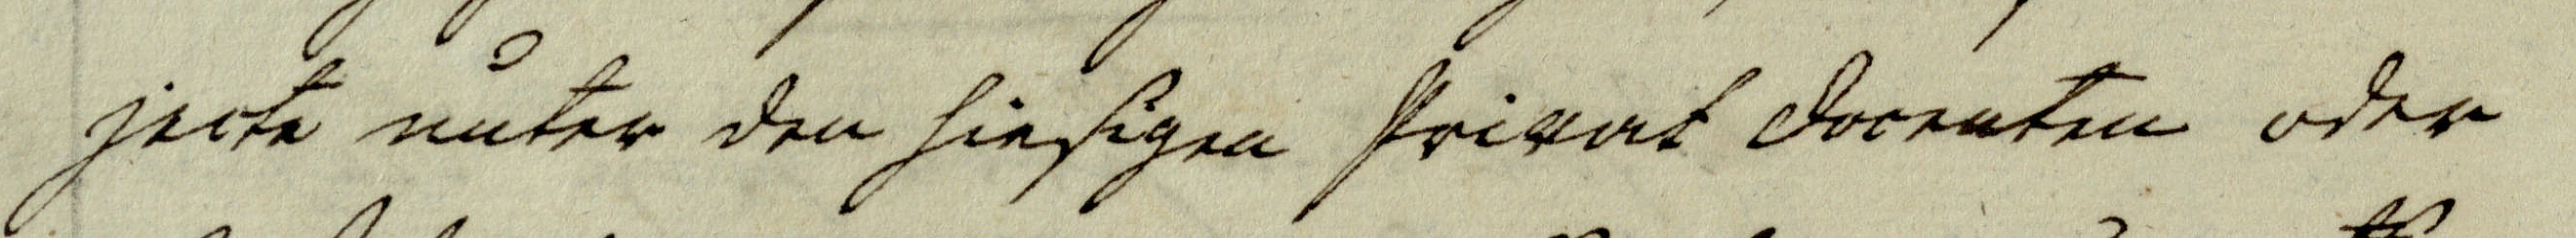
jecte unter den hiesigen Privat Docenten oder
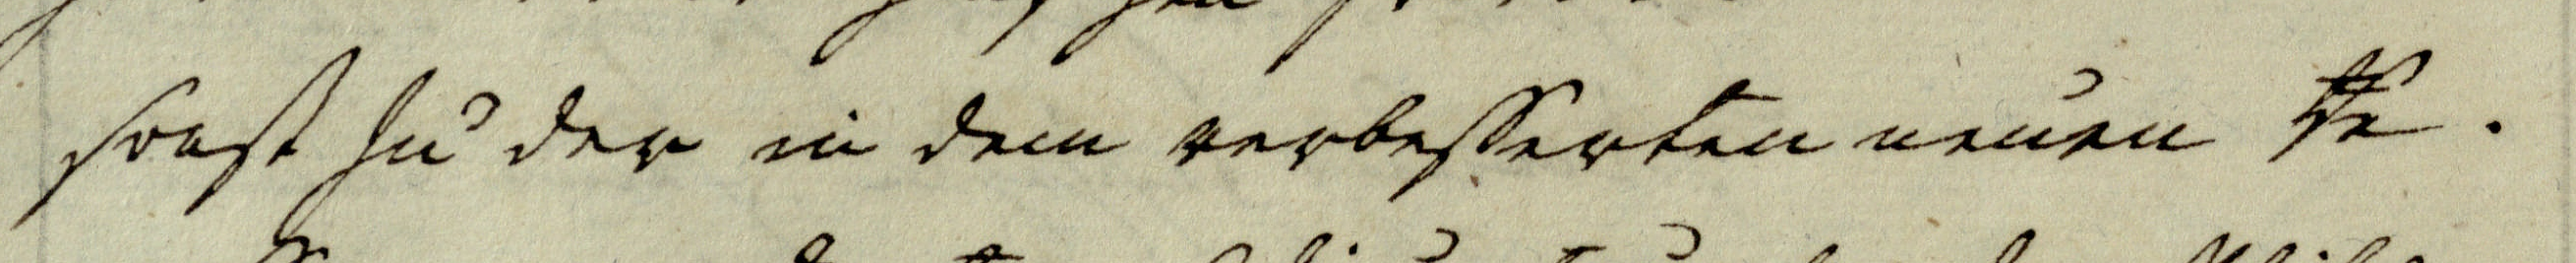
sonst zu der in dem verbesserten neuen Re¬
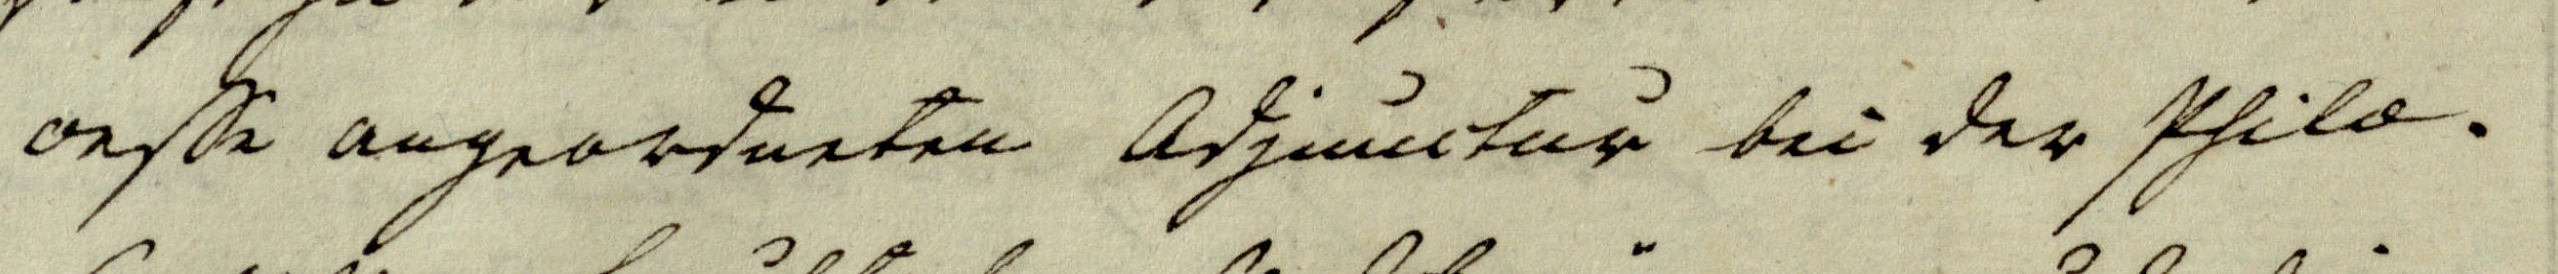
cesse angeordneten Adjunctur bei der Philo¬
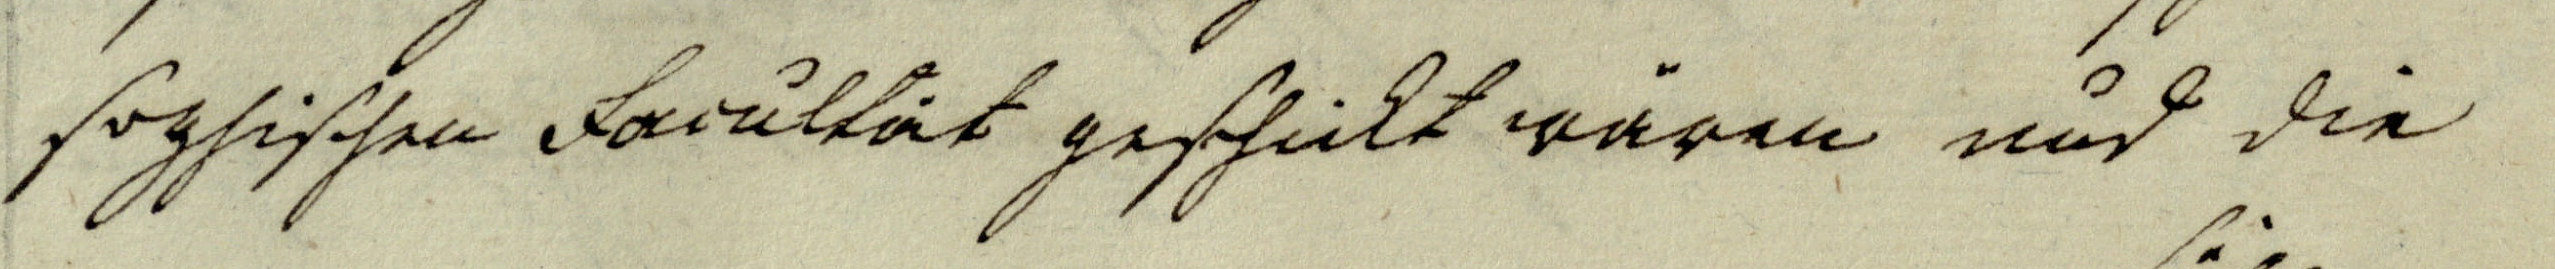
sophischen Facultät geschickt wären und die
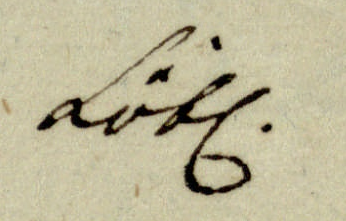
Löbl.
